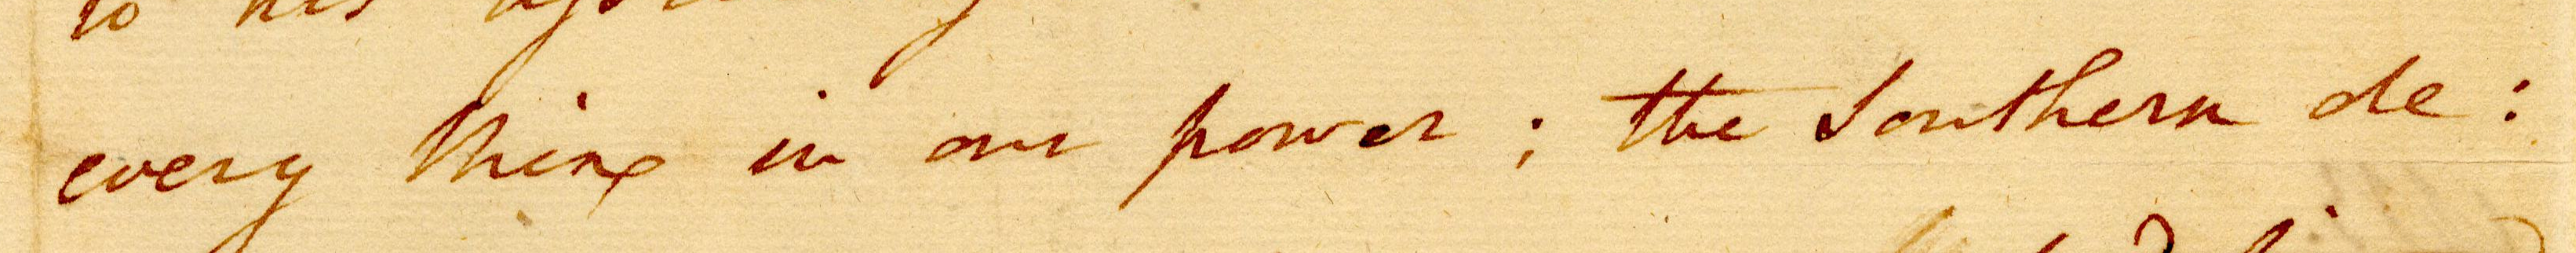every thing in our power; the Southern de-
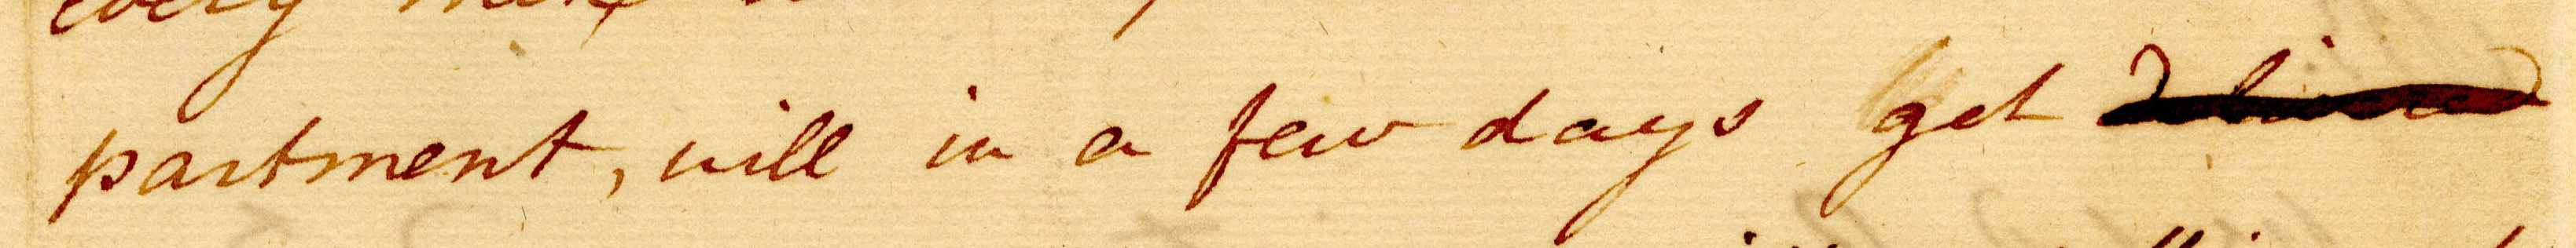partment, will in a few days get [delivered]
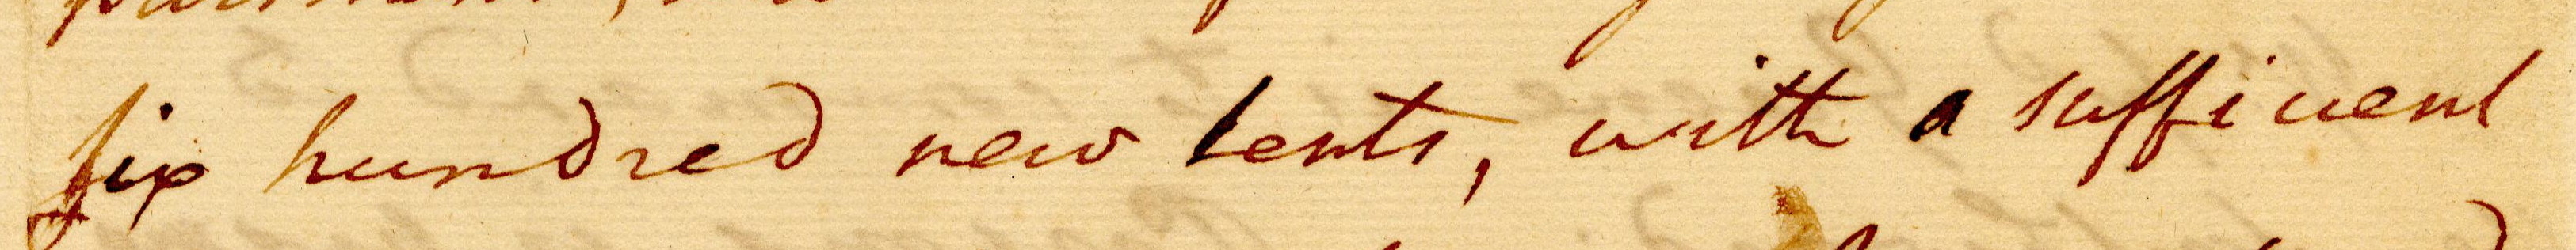six hundred new tents, with a sufficient
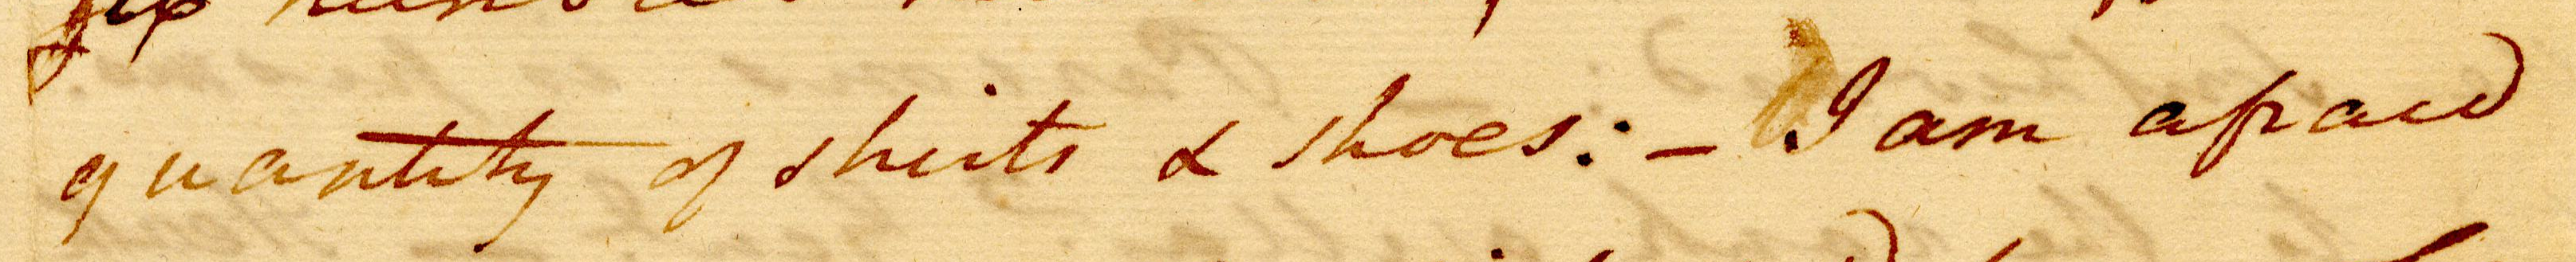quantity of shirts & shoes:- I am afraid
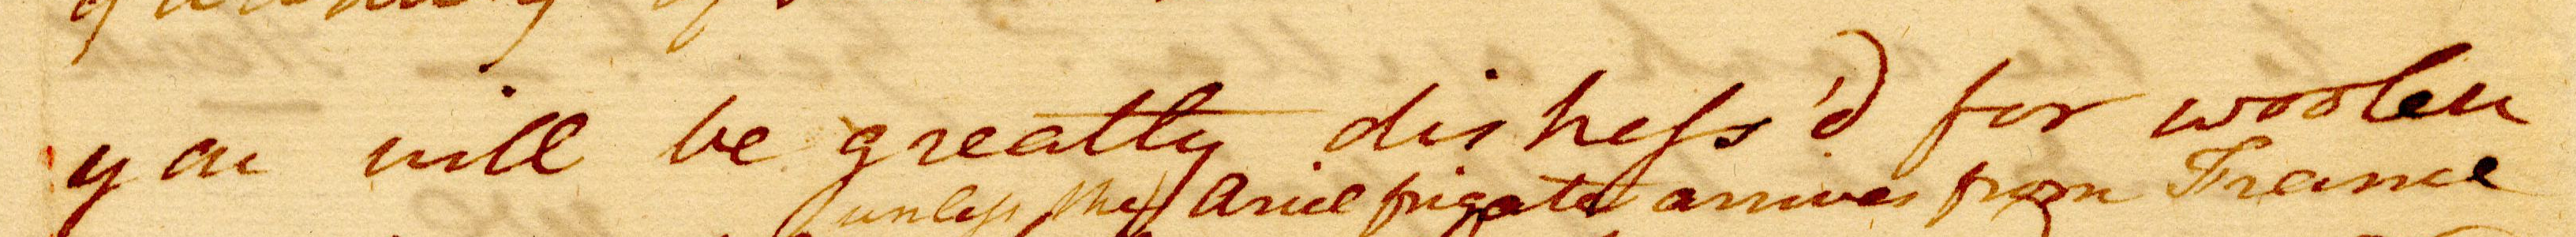you will be greatly distress'd for woolen
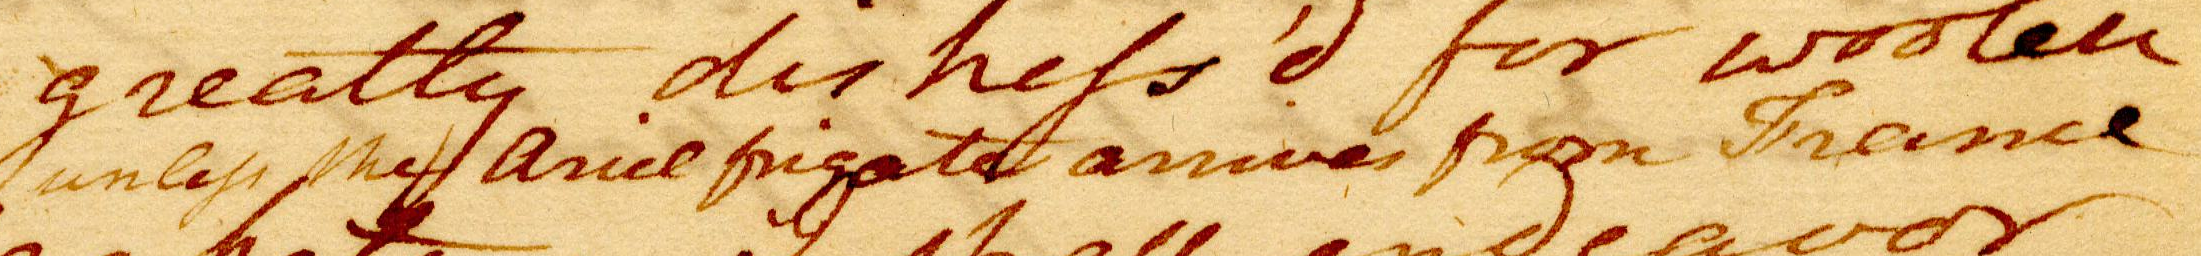unless the Ariel frigate arrives from France
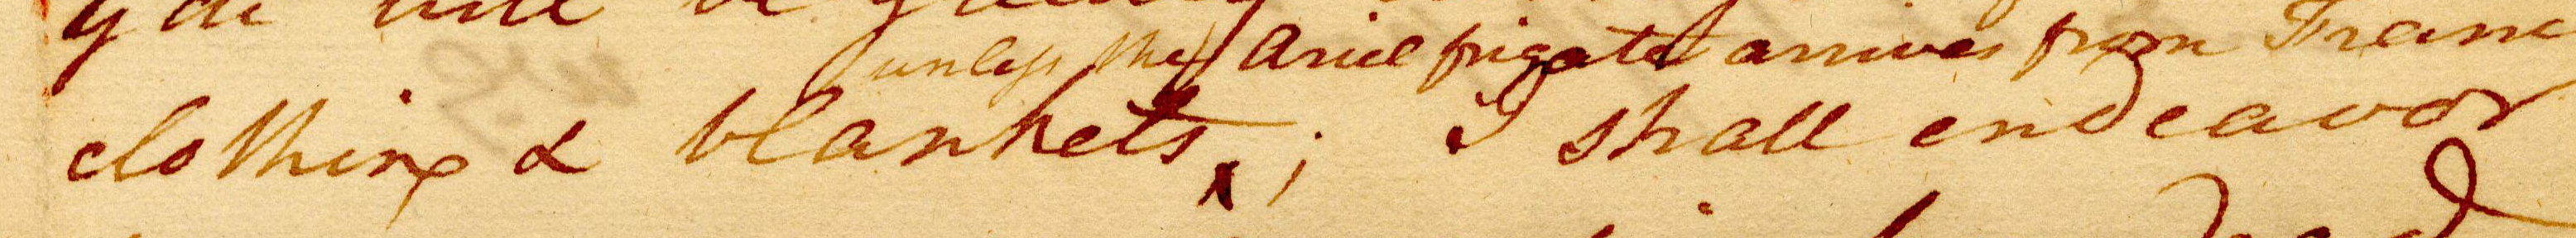clothing & blankets ^; I shall endeavor
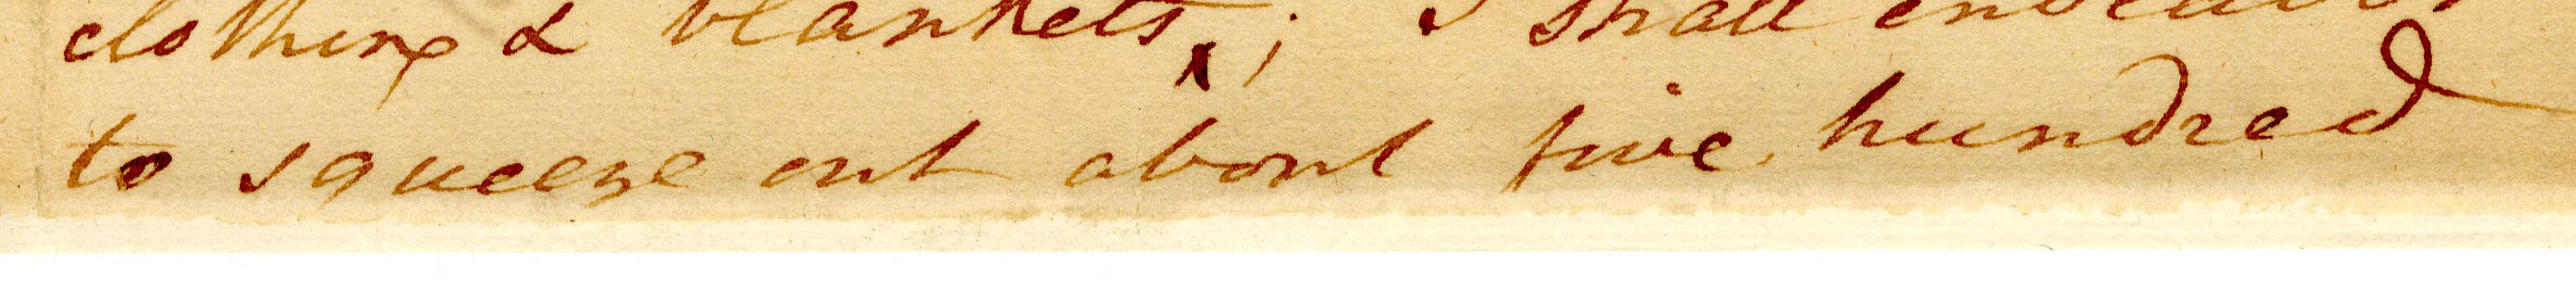to squeeze out about five hundred
